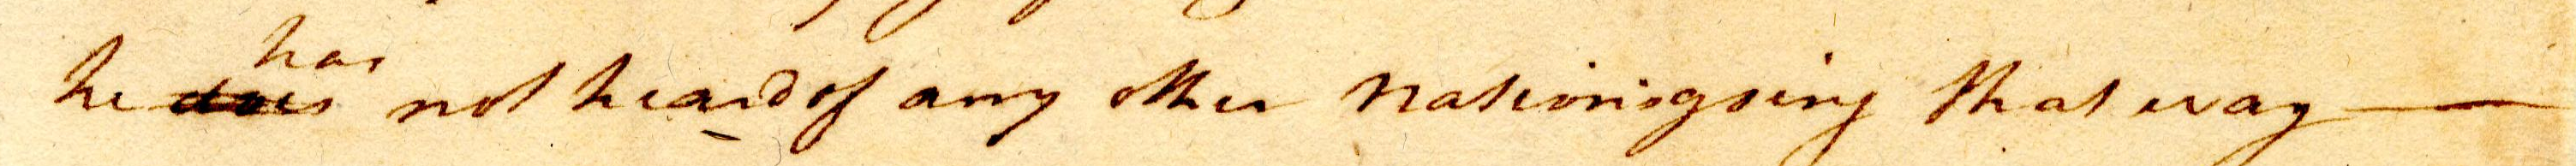he does ^has not heard of any other nations going that way-
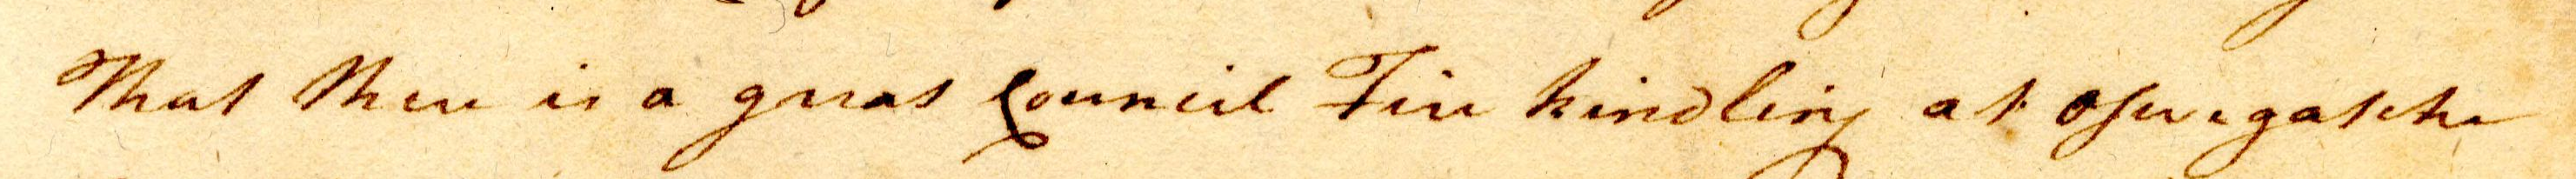That there is a great Council Fire kindling at oswegatche
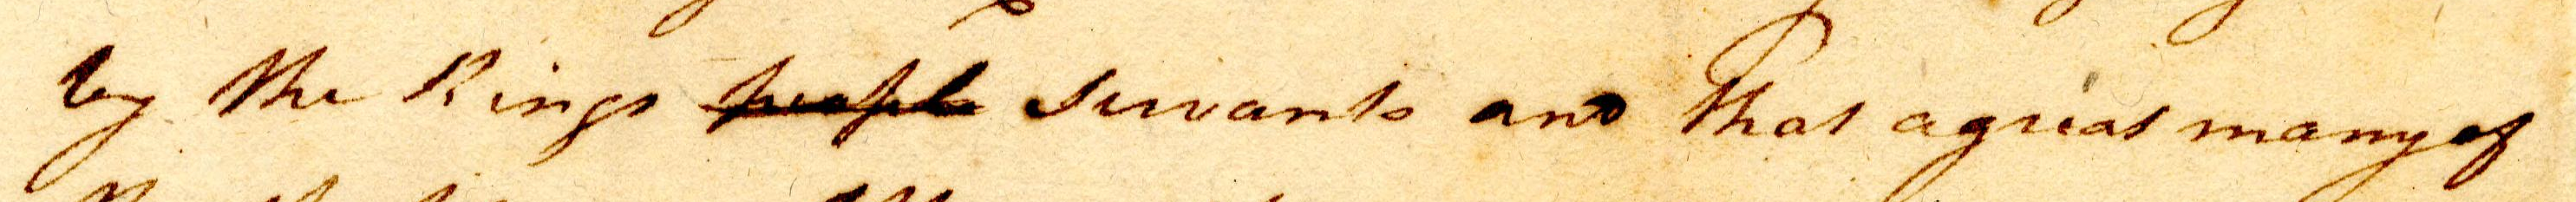by the Kings people servants and that a great many of
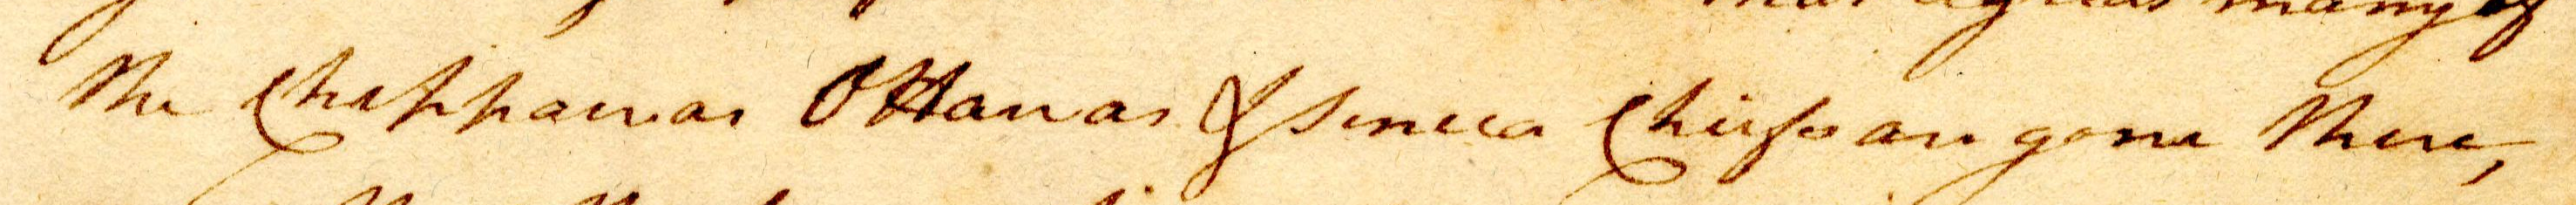the Chippawas & Ottawas & Seneca Chiefs are gone there,-
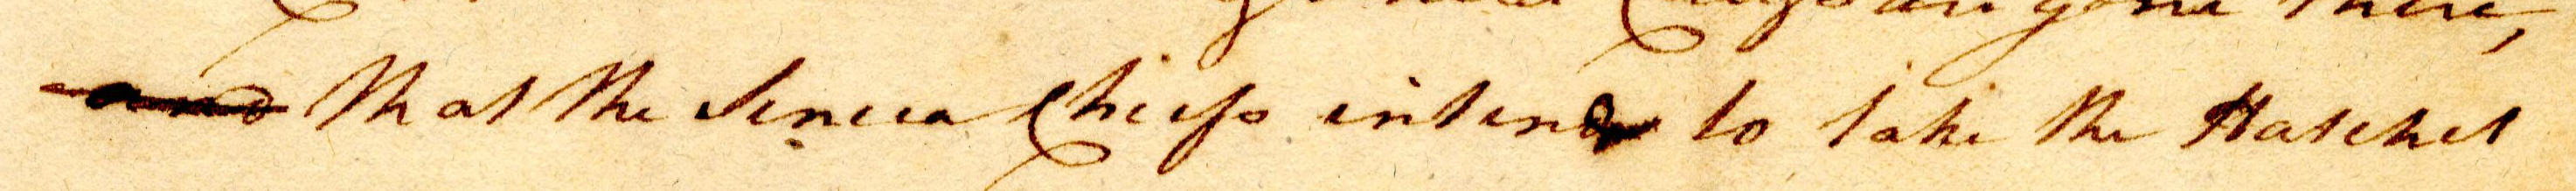and that the Seneca Chiefs intend to take the Hatchet
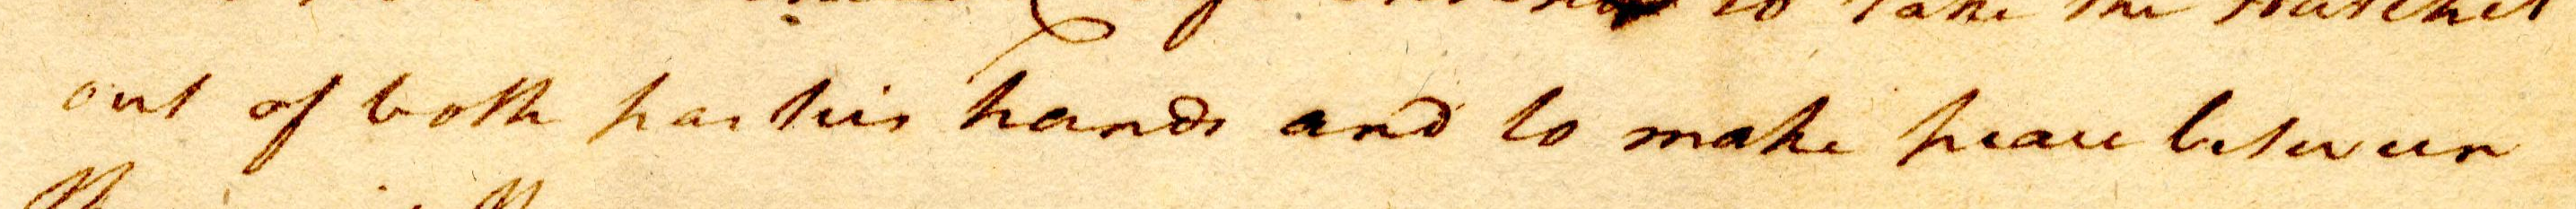out of both parties hands and to make peace between
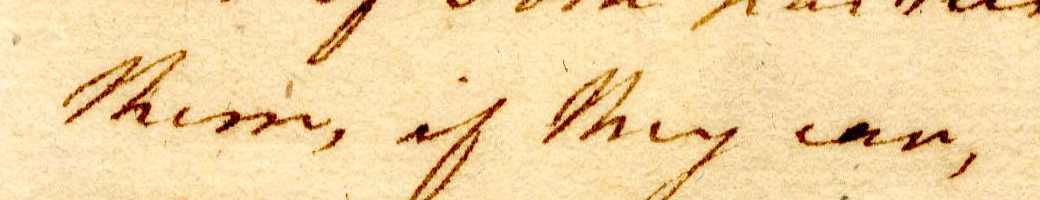them, if they can,
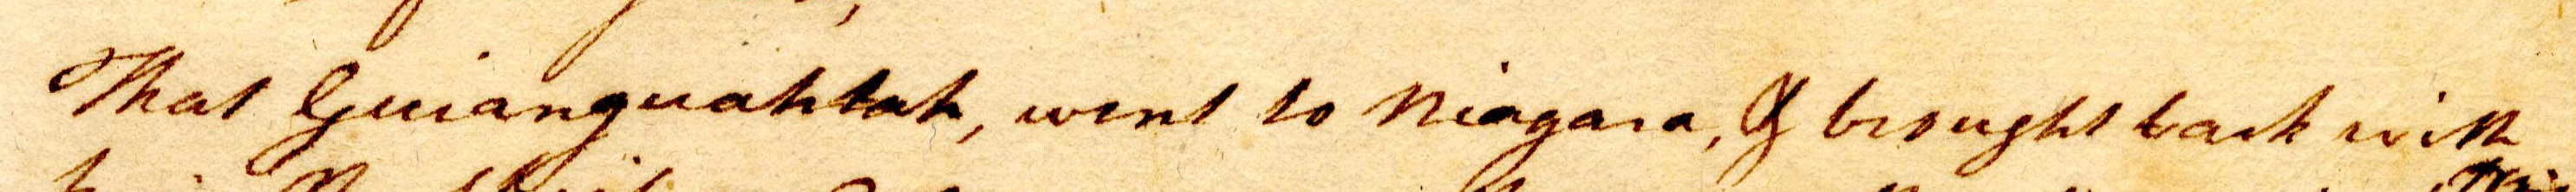That Guianguahtak, went to Niagara, & brought back with
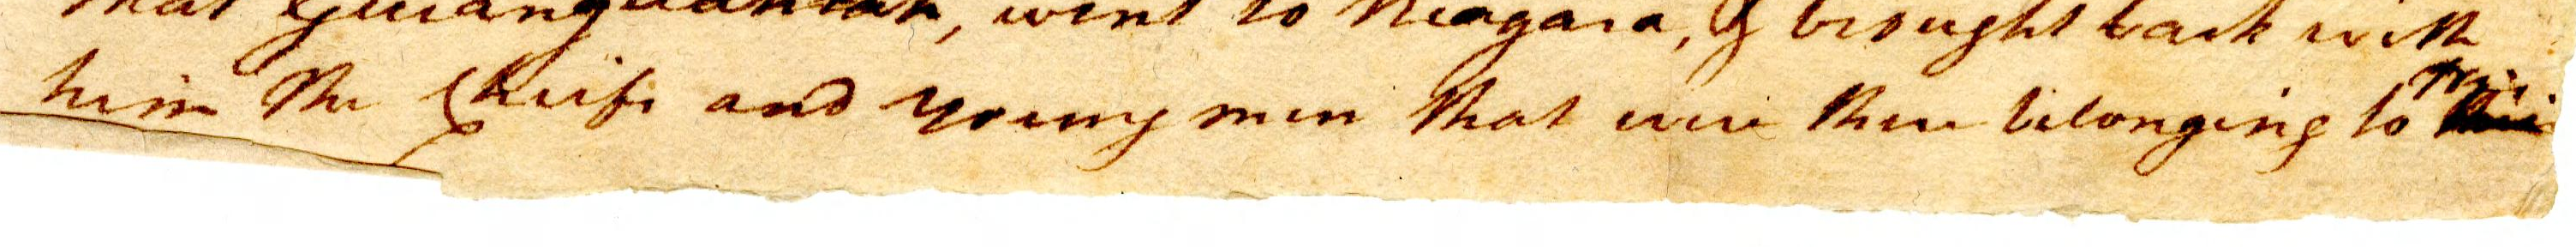him the Chiefs and young men that were there belonging to this
